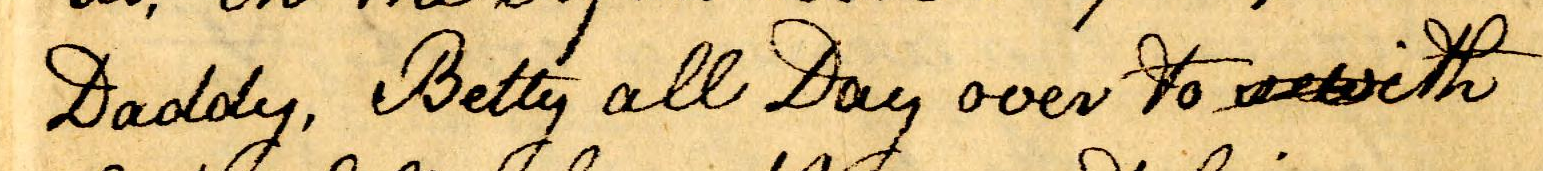Daddy, Betty all Day over to [__] with
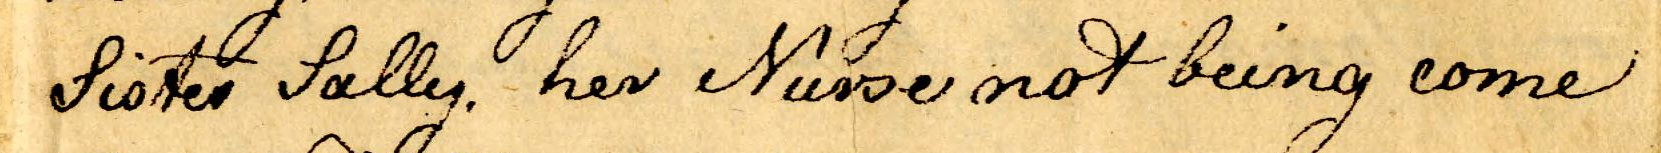Sister Sally, her Nurse not being come
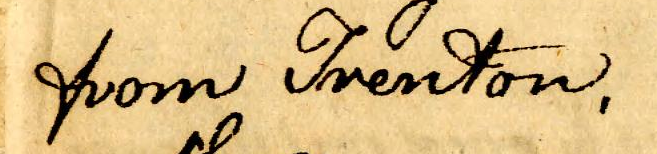from Trenton,
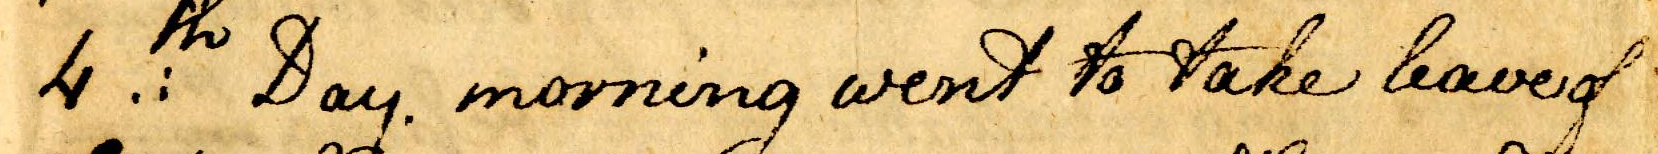4^th Day. morning went to take leave of
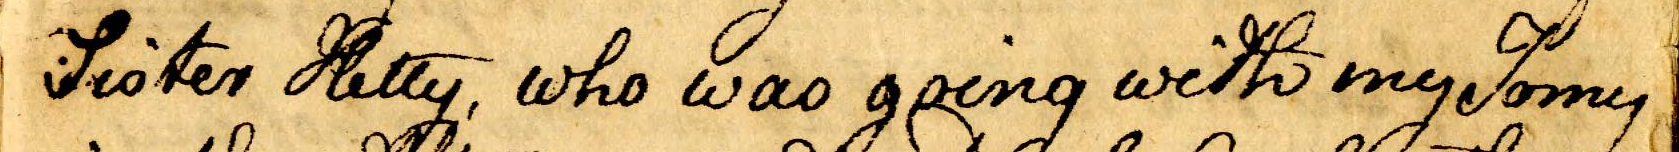Sister Hetty, who was going with my Tomy
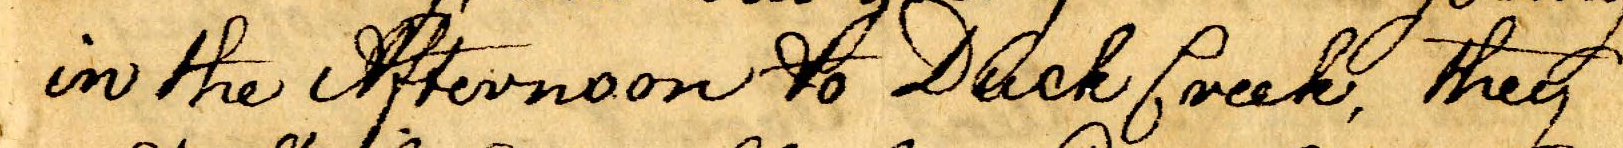in the Afternoon to Duck Creek, they
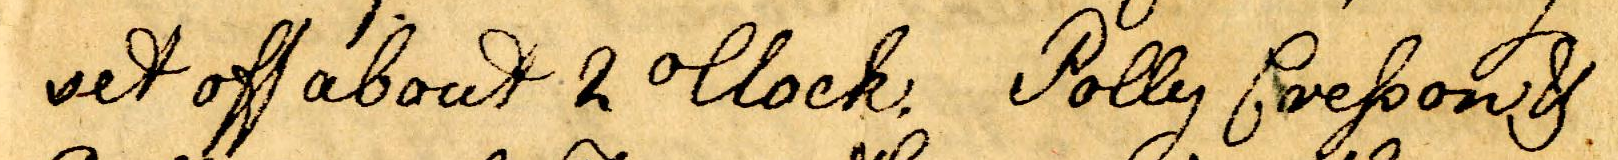set off about 2 ^oClock. Polly Cresson &
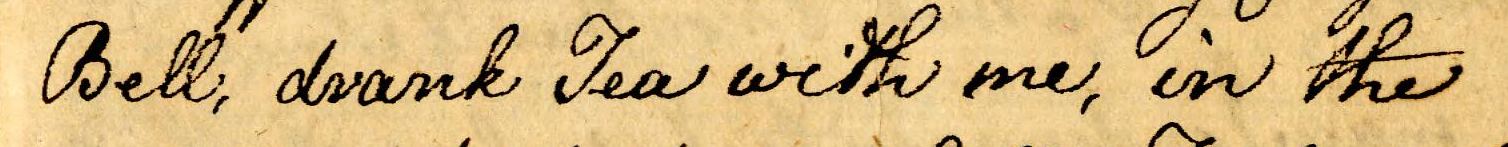Bell, drank Tea with me, in the
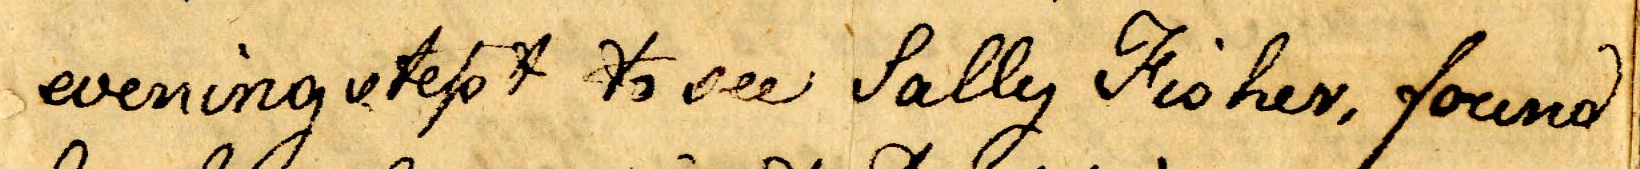evening stept to see Sally Fisher, found
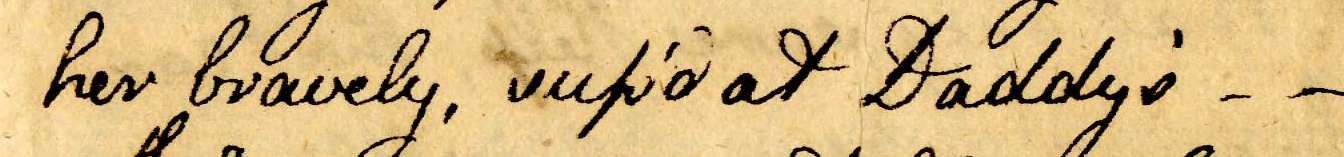her bravely, sup'd at Daddy's-
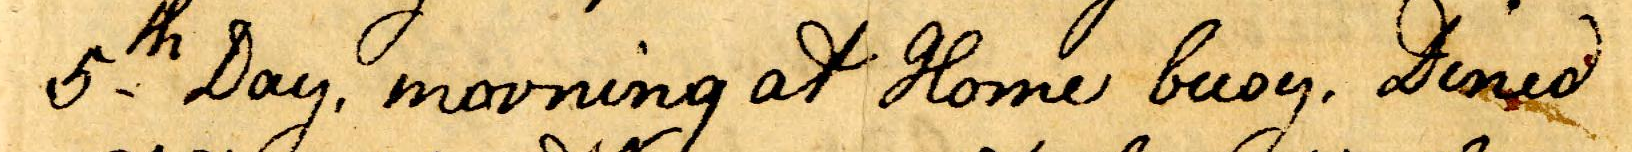5^th Day, morning at Home busy, Dined
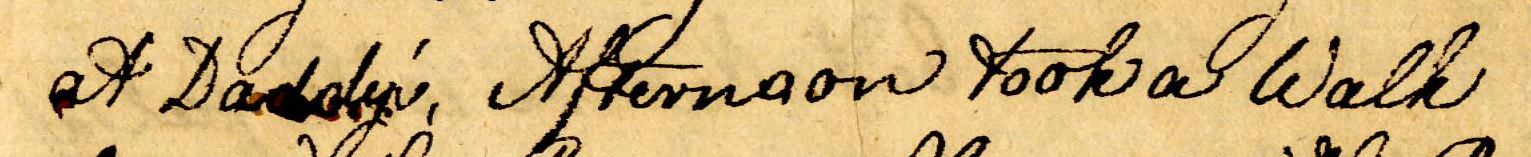at Daddy's, Afternoon took a Walk
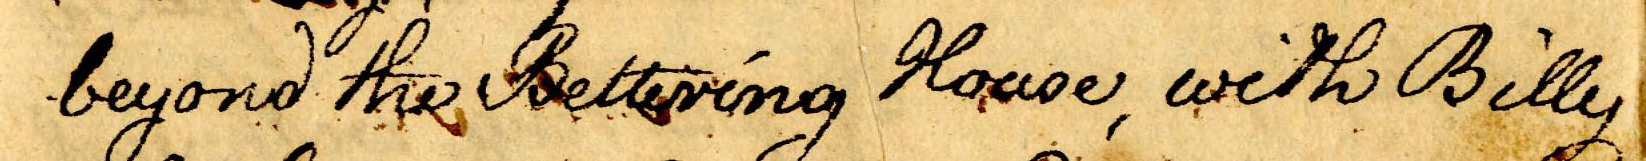beyond the Bettering House, with Billy
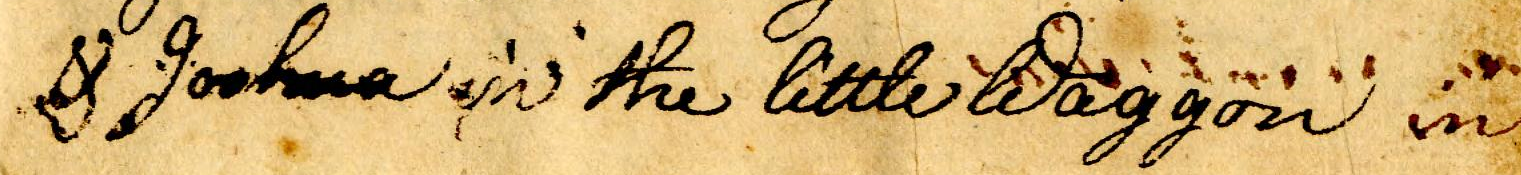& Joshua in the little Waggon in
